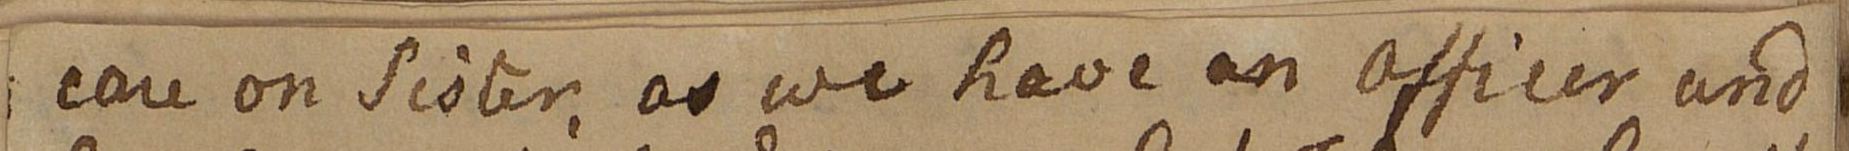care on Sister as we have an Officer and
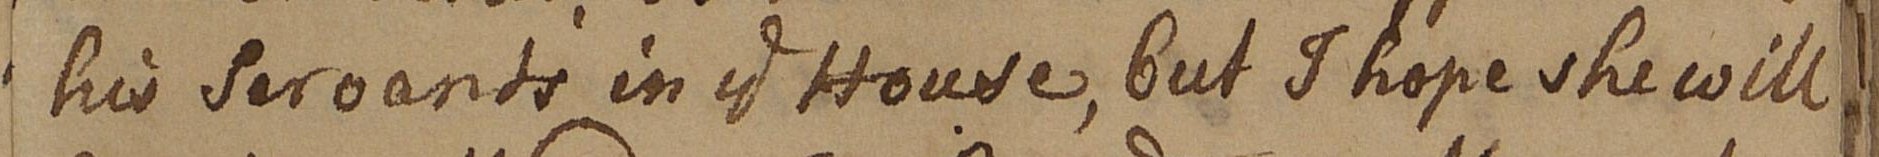his Servants in y^e House, but I hope she will
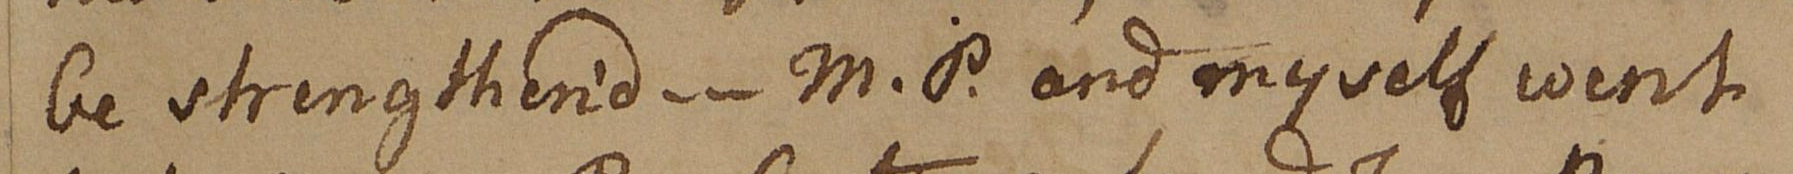be strengthen'd-- M.P. and myself went
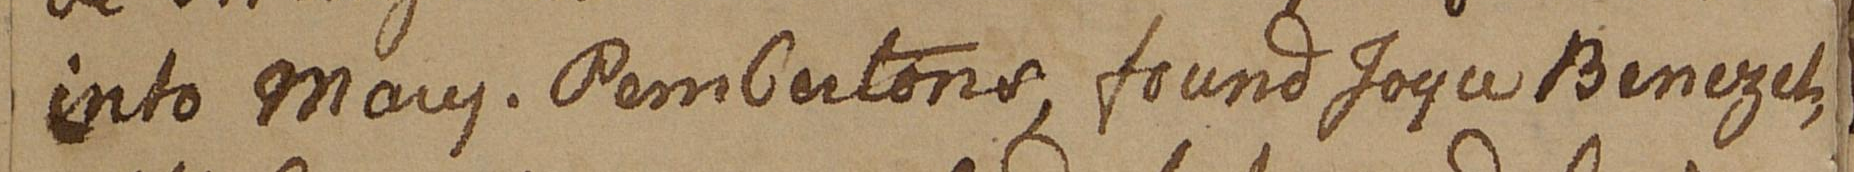into Mary. Pembertons, found Joyce Benezet,
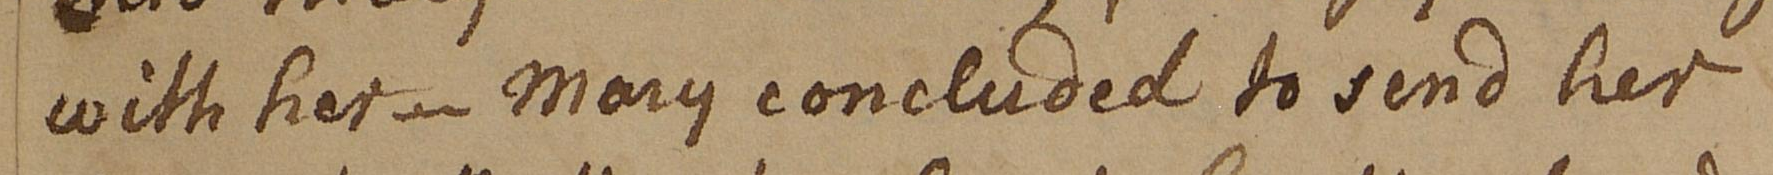with her- Mary concluded to send her
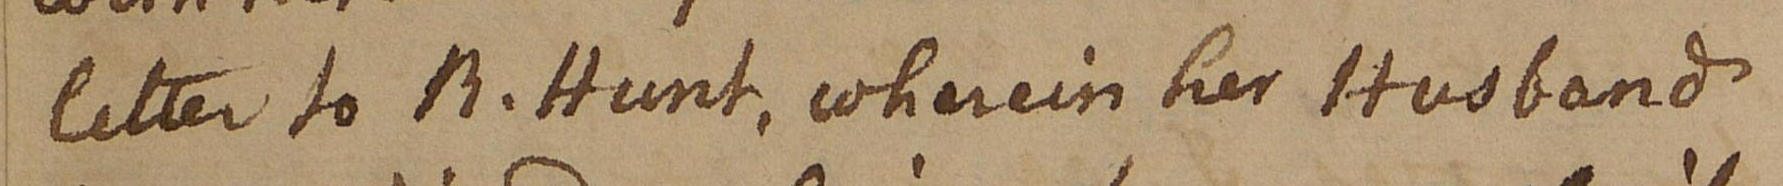letter to R. Hunt, wherein her Husband
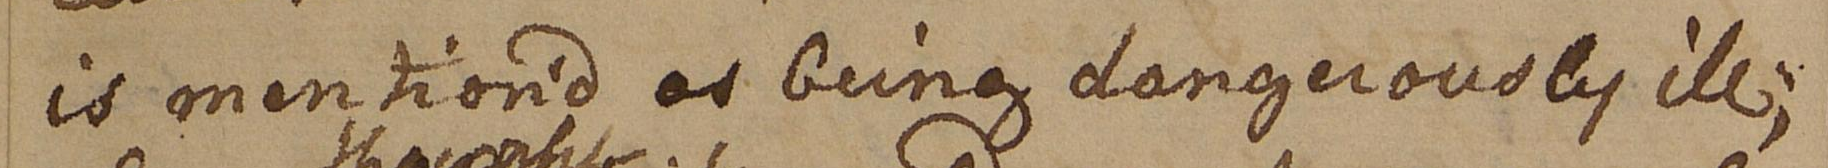is mention'd as being dangerously ill,
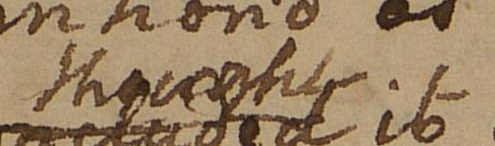thought
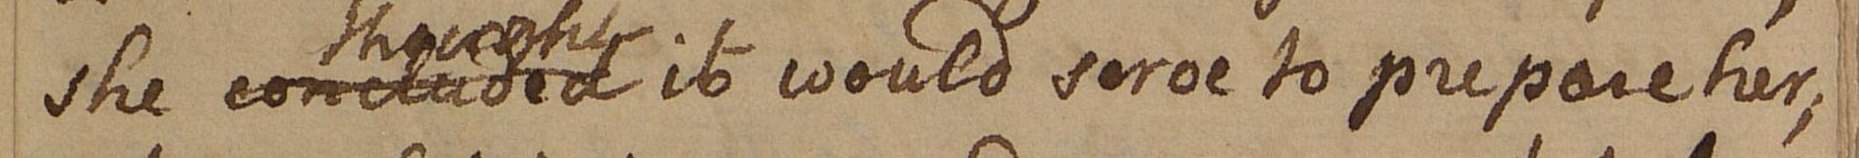she concluded it would serve to prepare her;
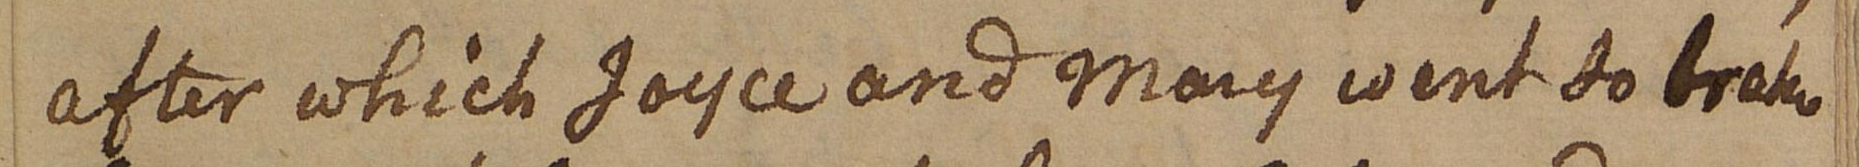after which Joyce and Mary went to brake
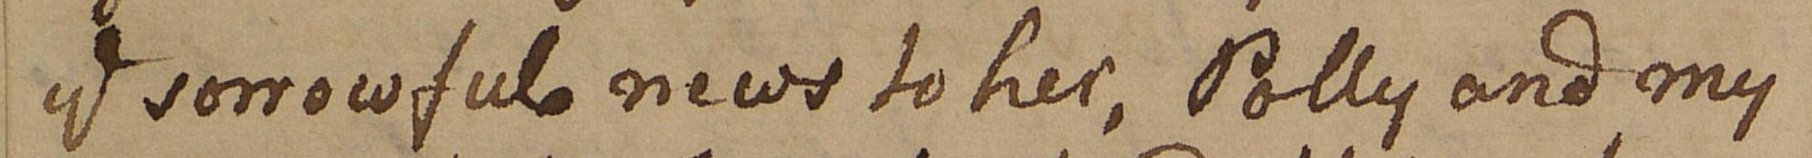y^e sorrowful news to her, Polly and my
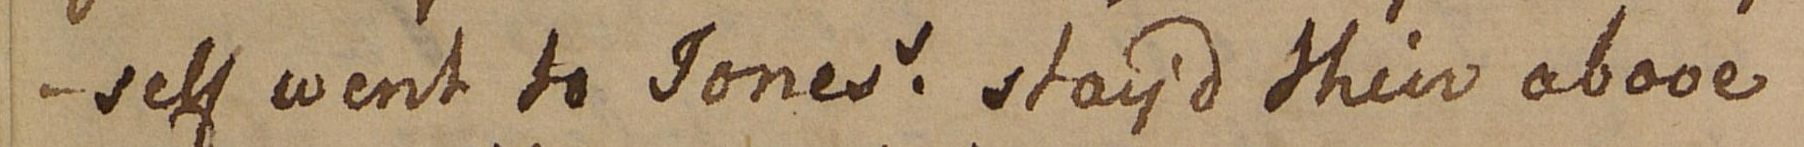-self went to Jones^s. stay'd their above
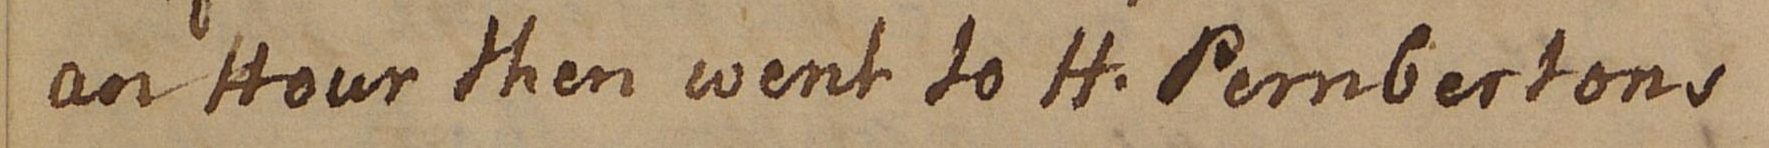an Hour then went to H. Pembertons
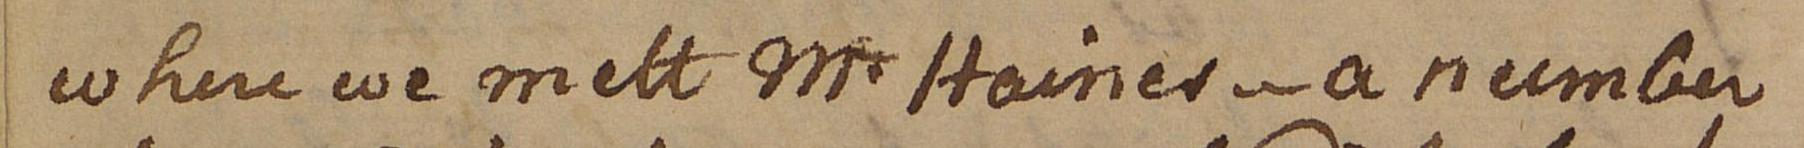where we mett M. Haines- a number
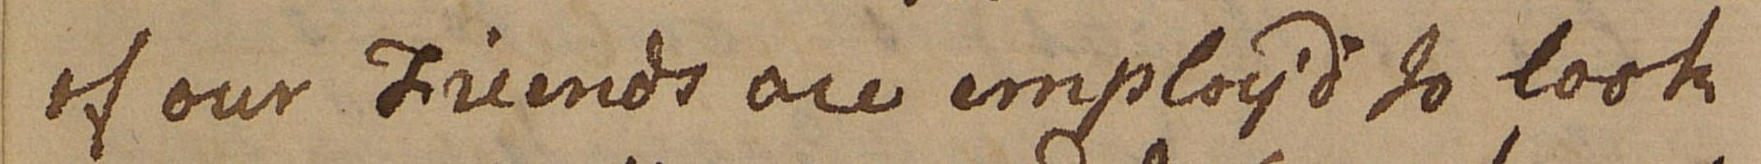of our Friends are employ'd to look
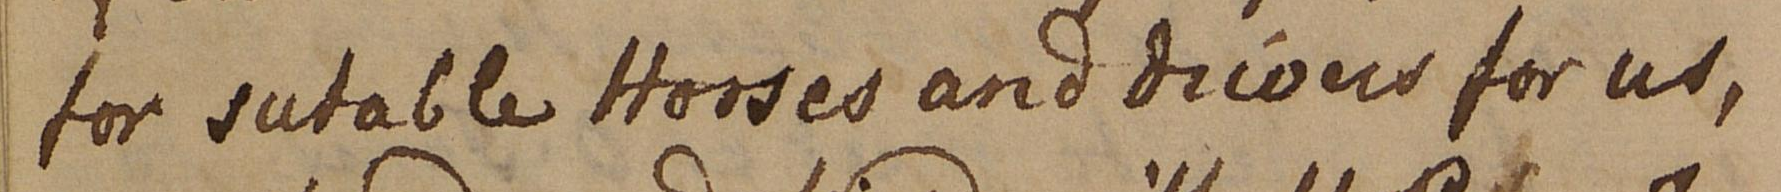for sutable Horses and drivers for us,
